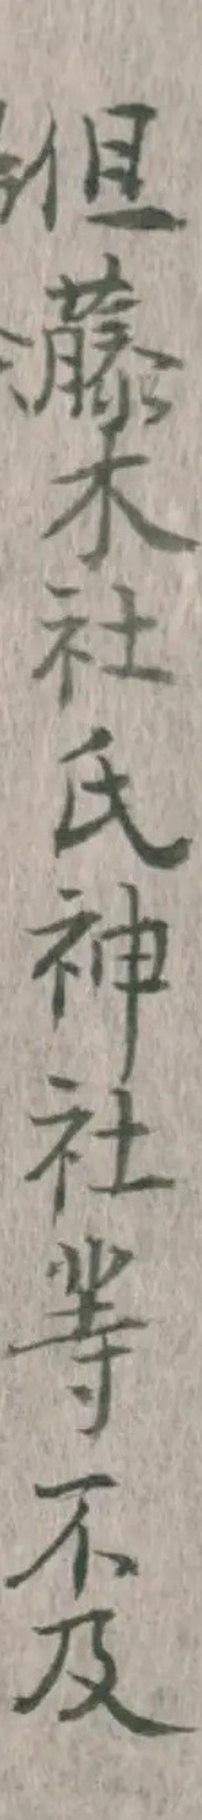但藤木社氏神社等不及
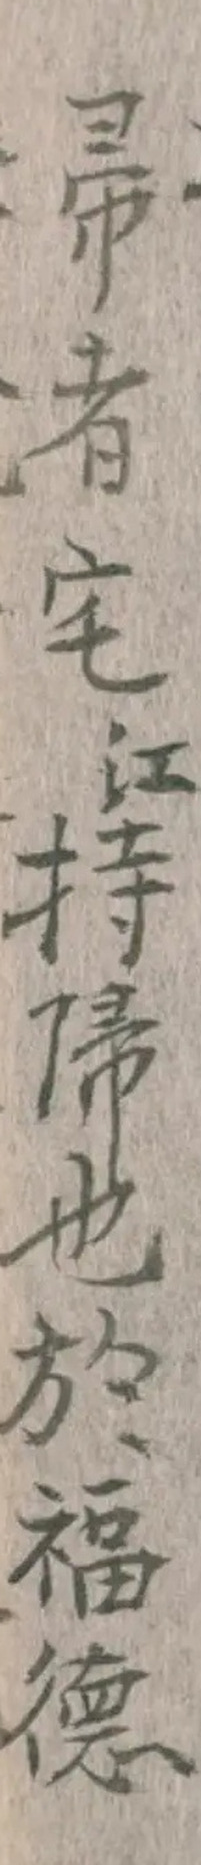箒者宅江持帰也於福徳
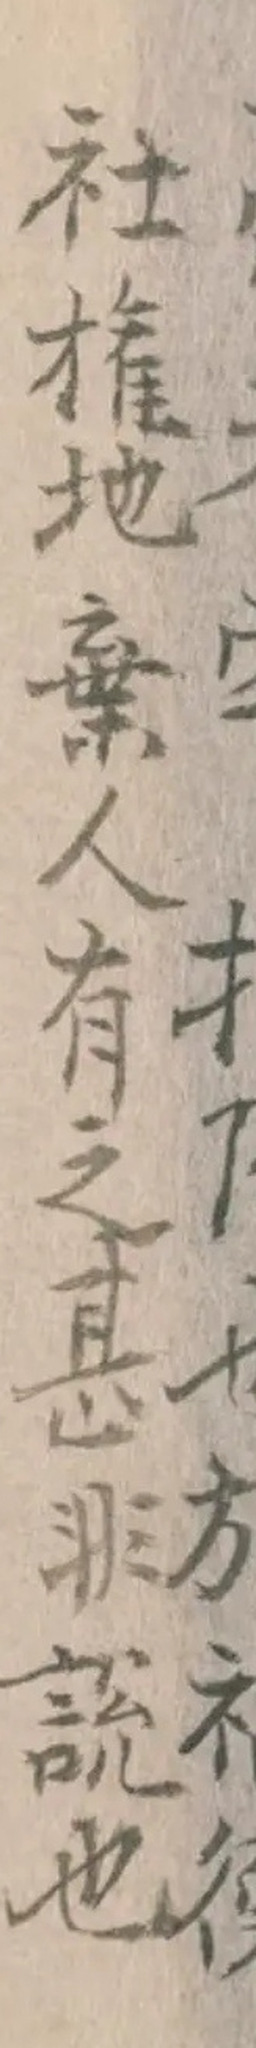社権地棄人有之甚非説也
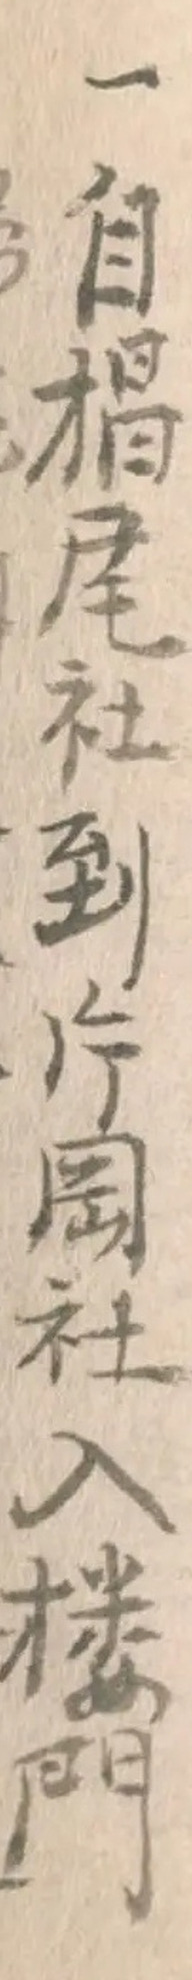一自椙尾社到片岡社入楼門
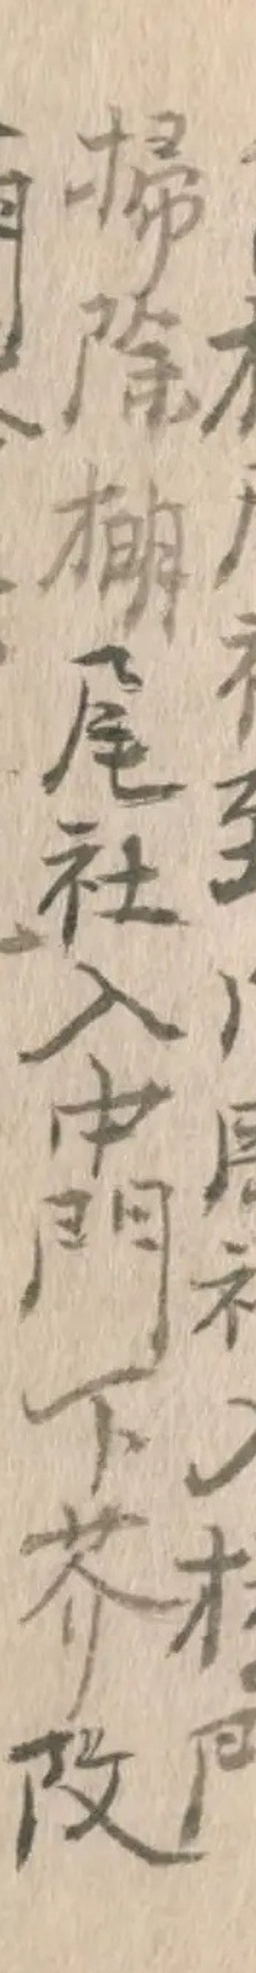掃除棚尾社入中門下芥改
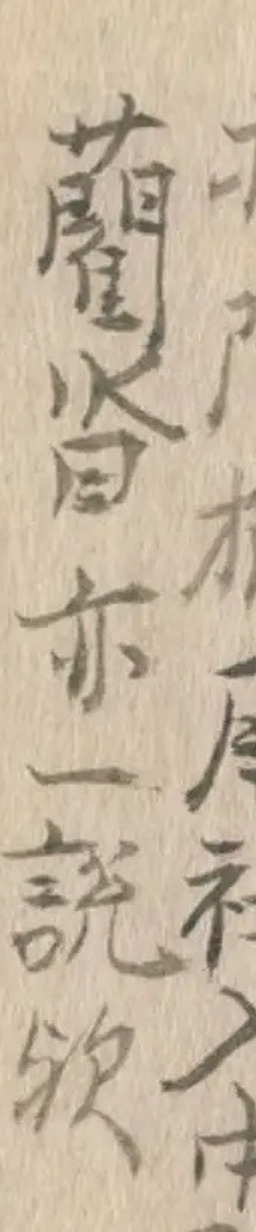藺沓亦一説歟
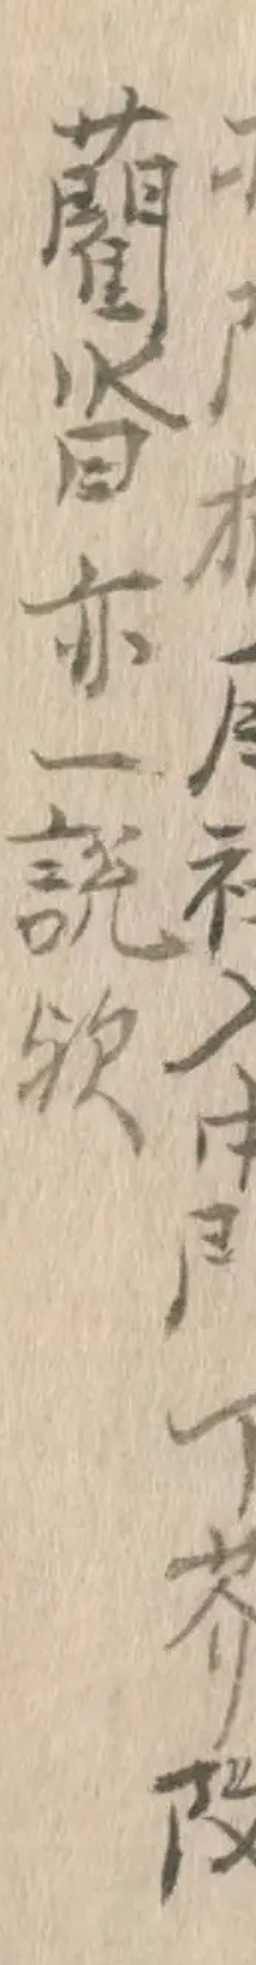藺沓亦一説歟
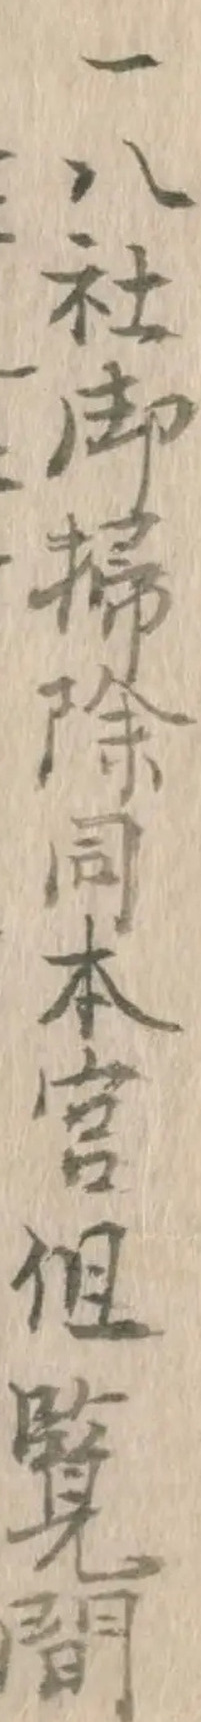一八社御掃除同本宮但覧間
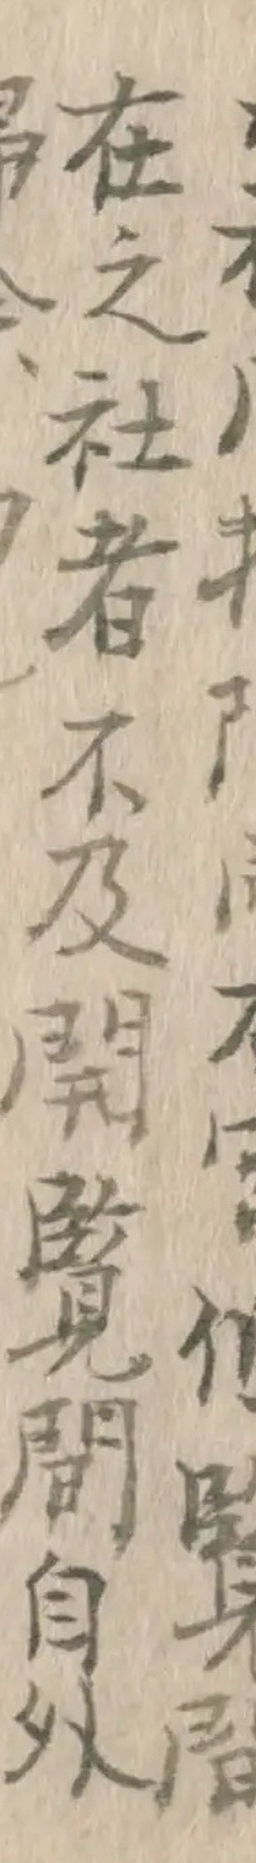在之社者不及開覧間自外
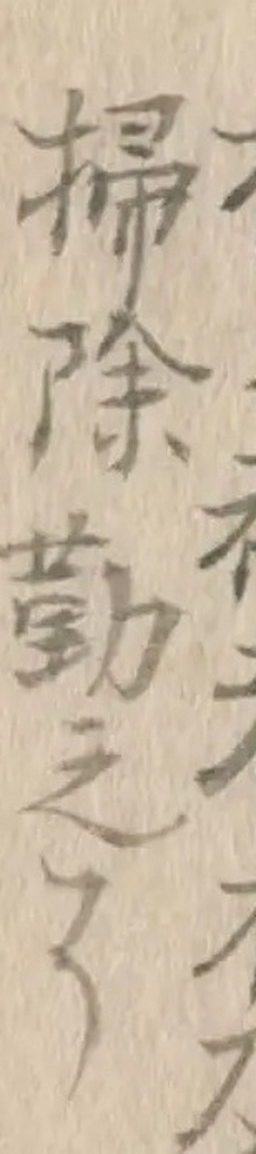掃除勤之了

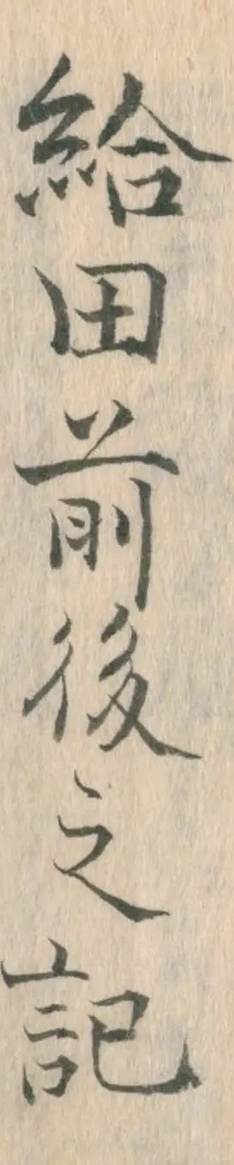給田前後之記

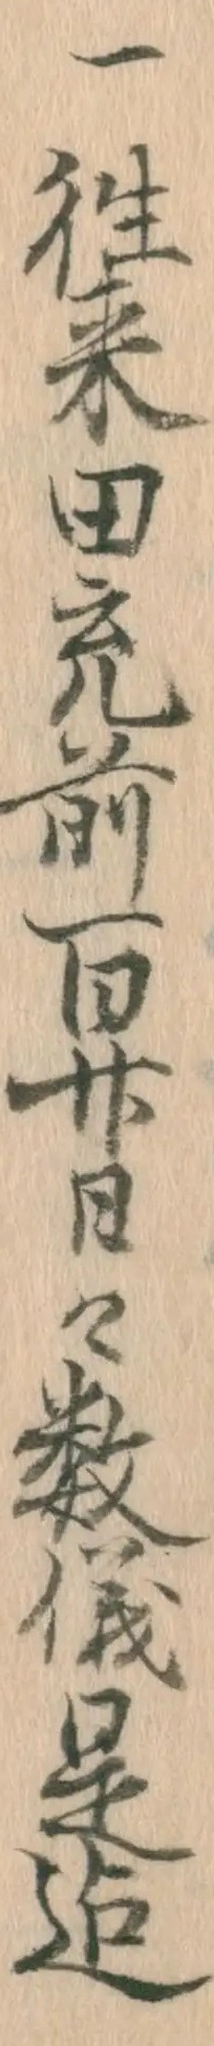一往来田充前百廿日々数儀是迄
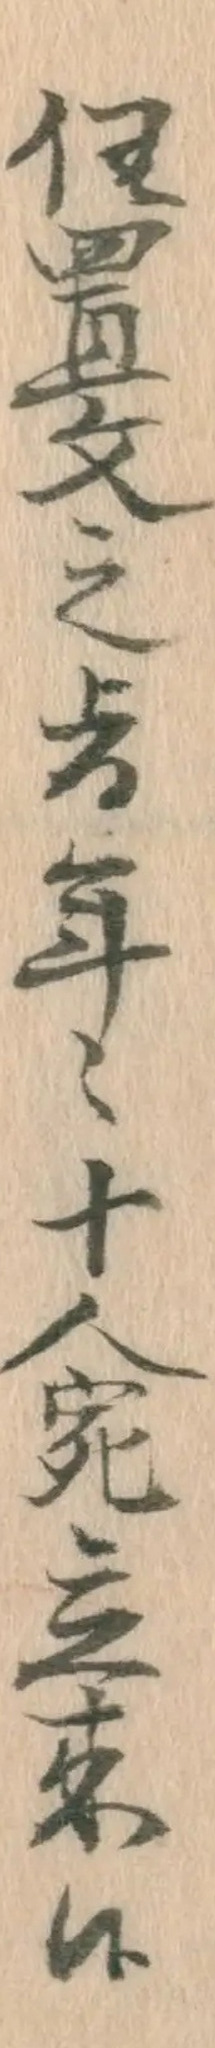任置文之旨年々十人宛立来候
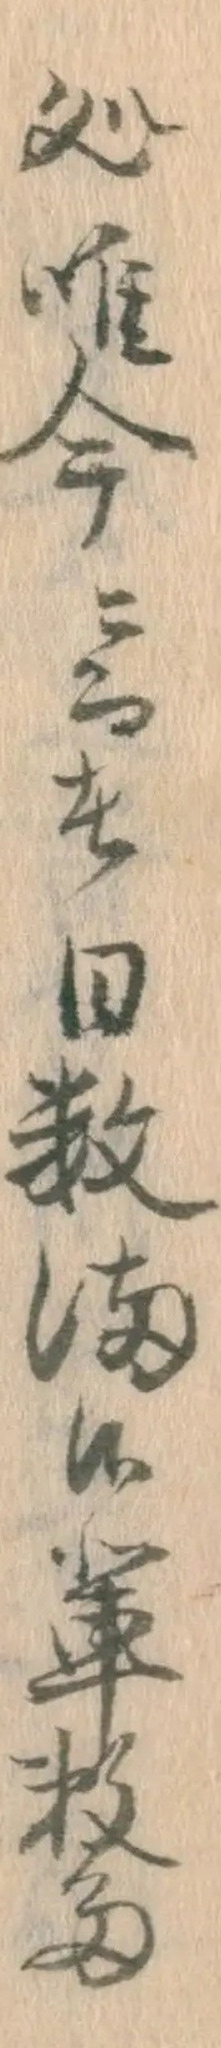処唯今ニ而は日数満候輩数多
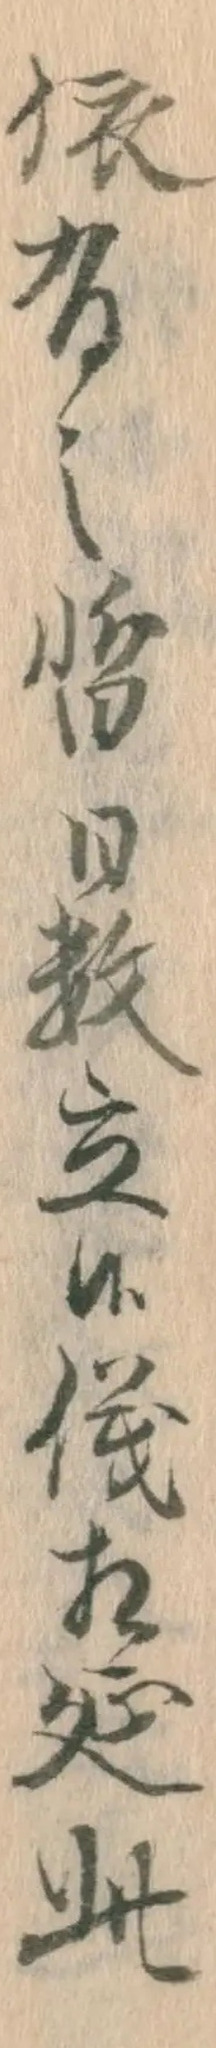依有之暫日数立候儀相延此
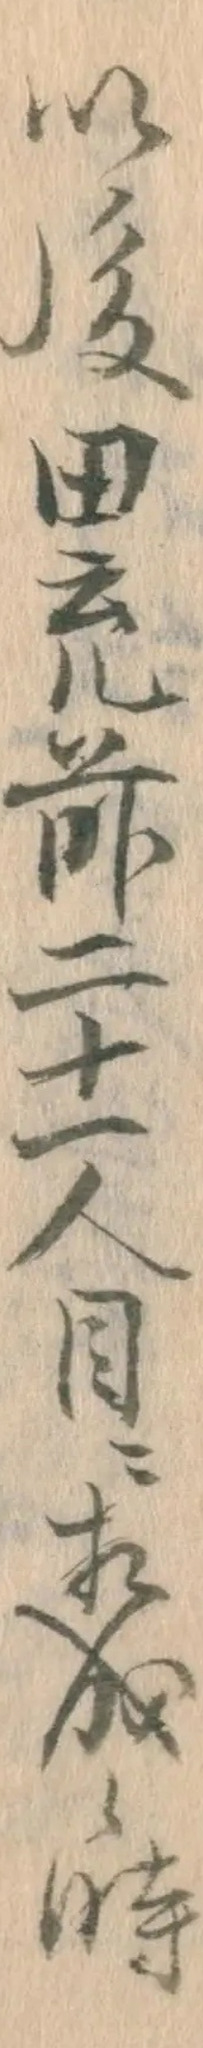以後田充前二十一人目ニ相成候時
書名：賀茂社記録. 第81冊
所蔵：国立国会図書館 National Diet Library, JAPAN
